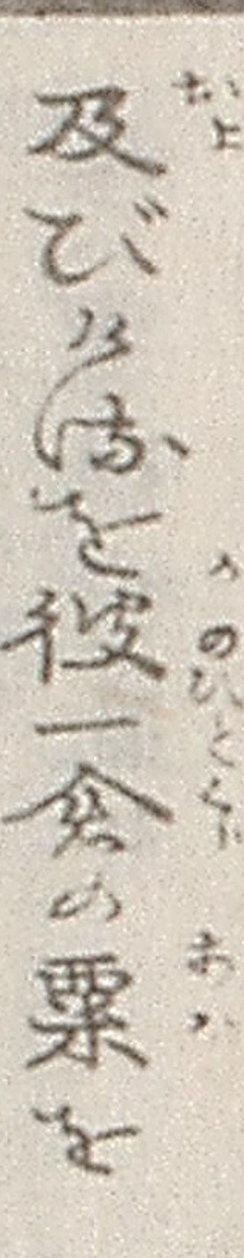及びけるを彼一倉の粟を
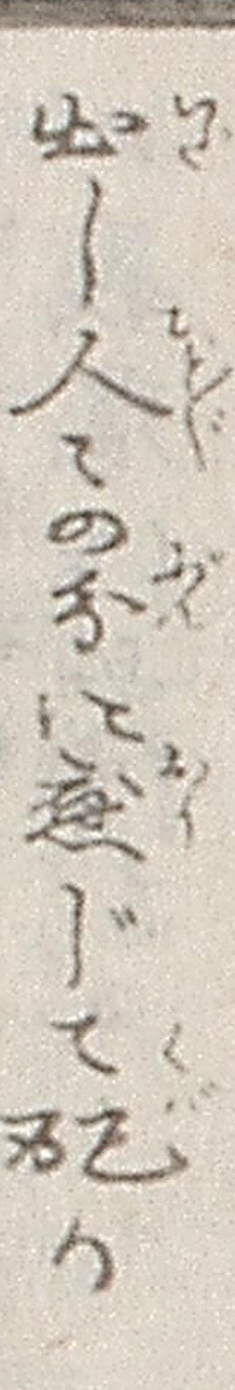出し人〻の分に応じて配り
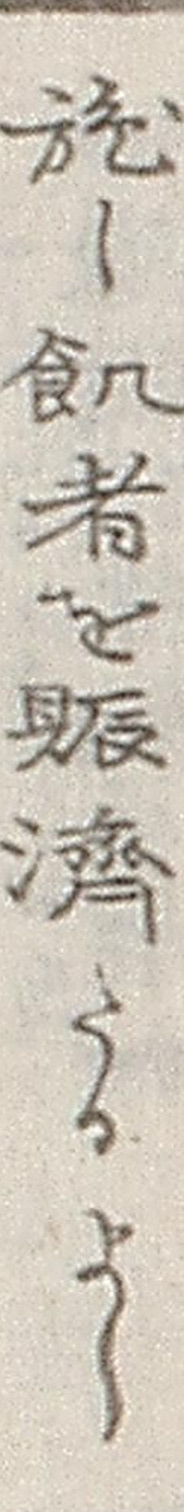施し飢者を賑濟たるよし
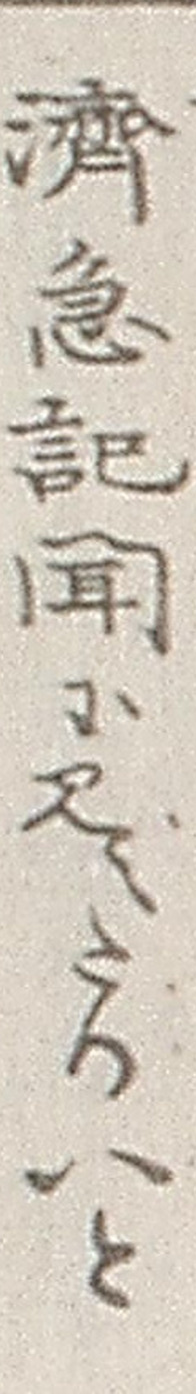濟急記聞に見えたりいと
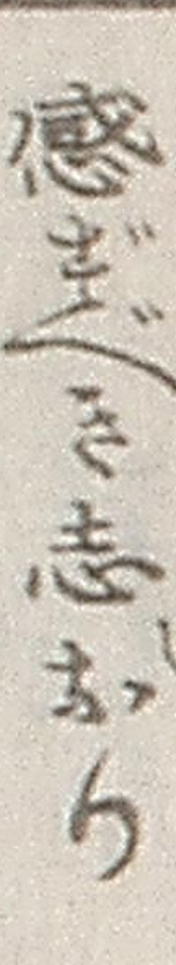感ずべき志なり

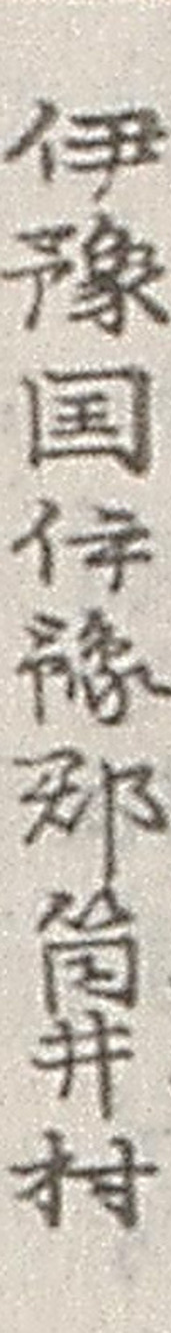伊豫国伊豫郡筒井村
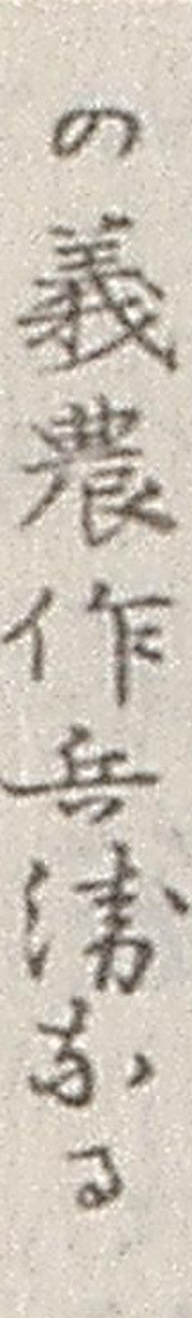の義農作兵衛なる
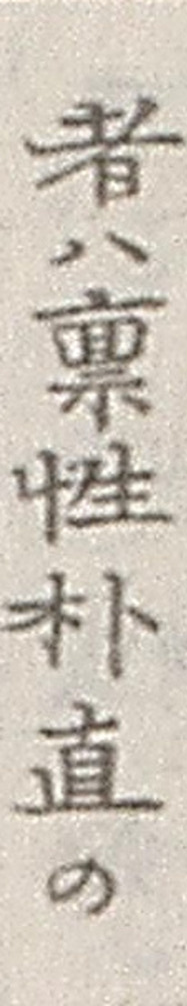者は禀性朴直の
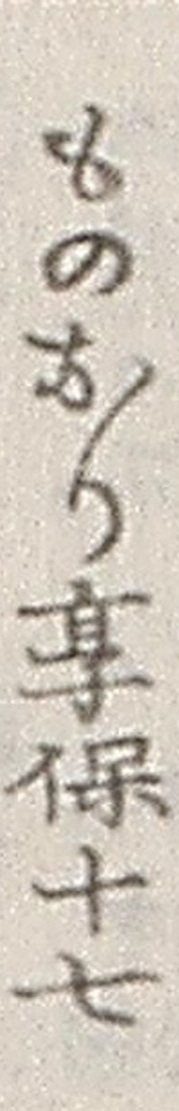ものなり享保十七
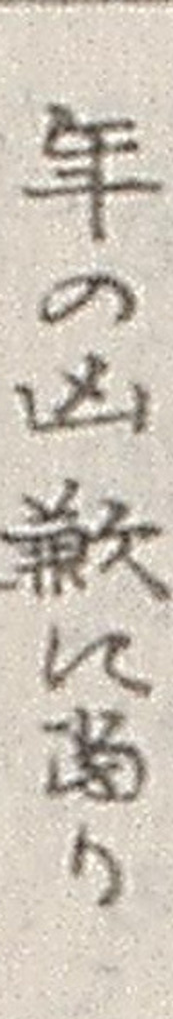年の凶歉に当り
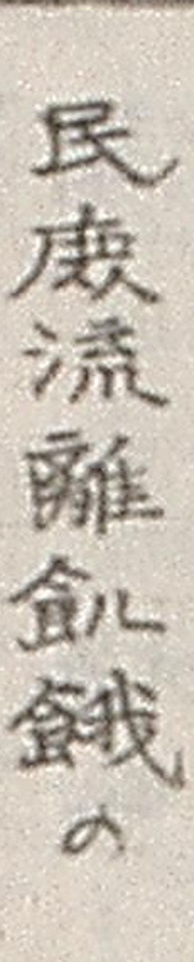民庶流離飢餓の
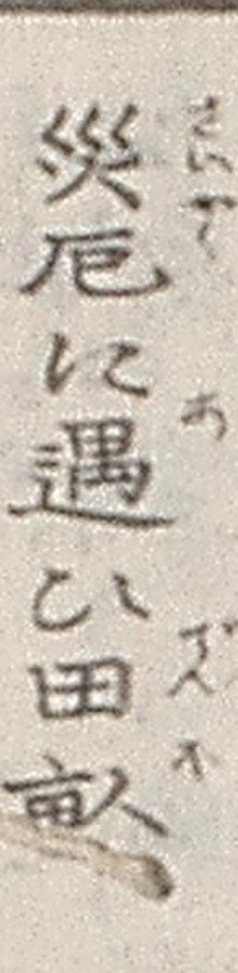災厄に遇ひ田畝
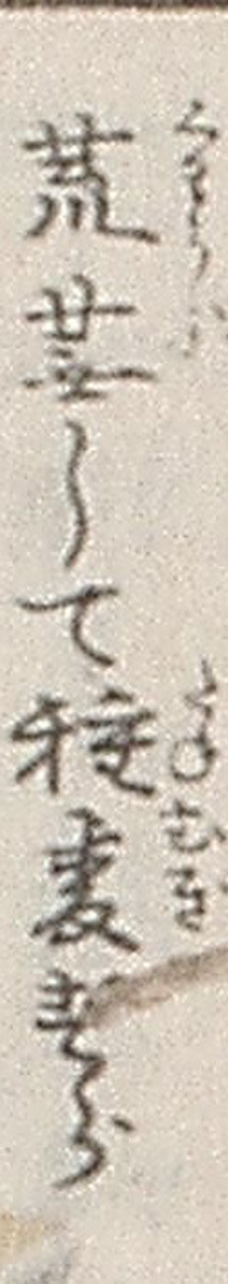荒蕪して種麦すら
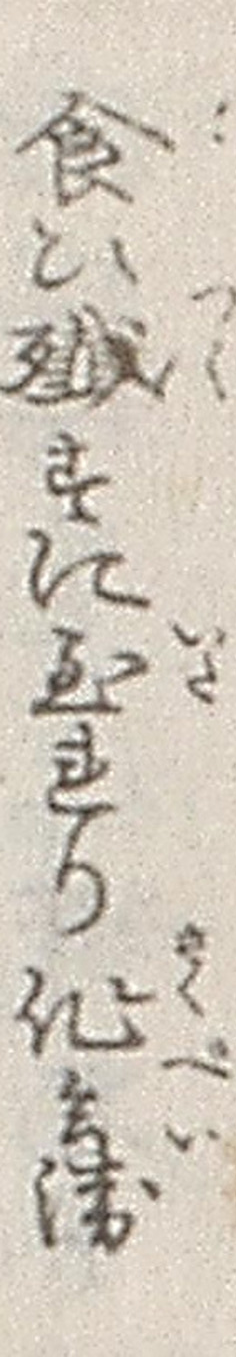食ひ殲すに至れり作兵衛
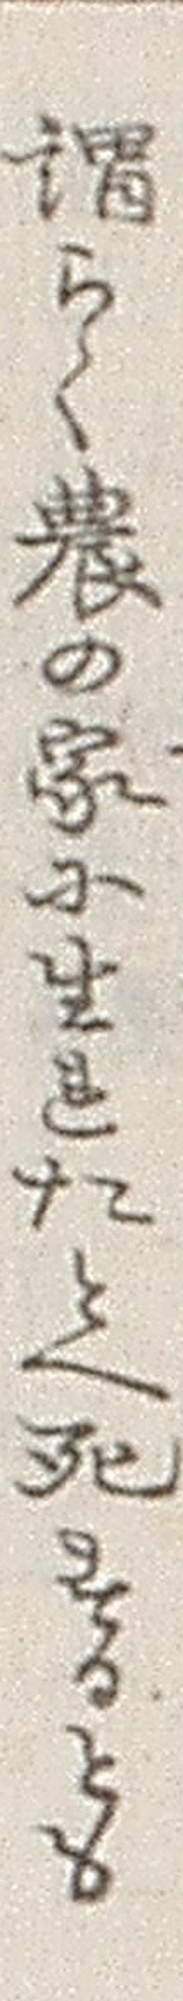謂らく農の家に生れたとへ死するとも
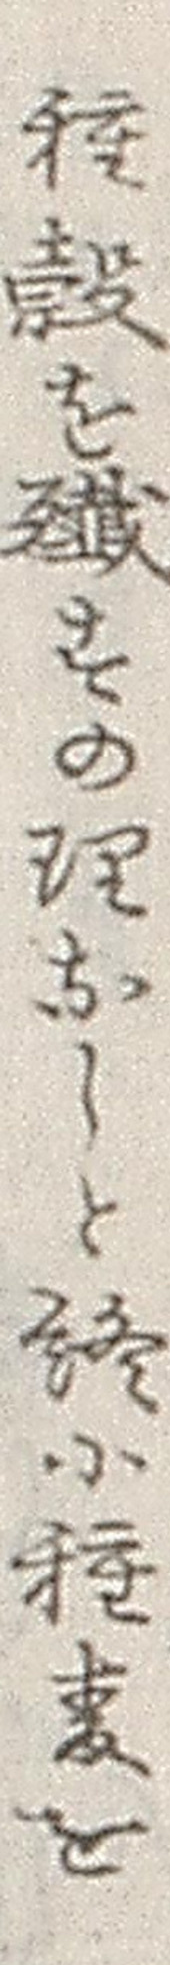種穀を殲すの理なしと終に種麦を
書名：凶荒図録　完
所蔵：東京大学地震研究所図書室 Earthquake Research Institute Library, The University of Tokyo, JAPAN
